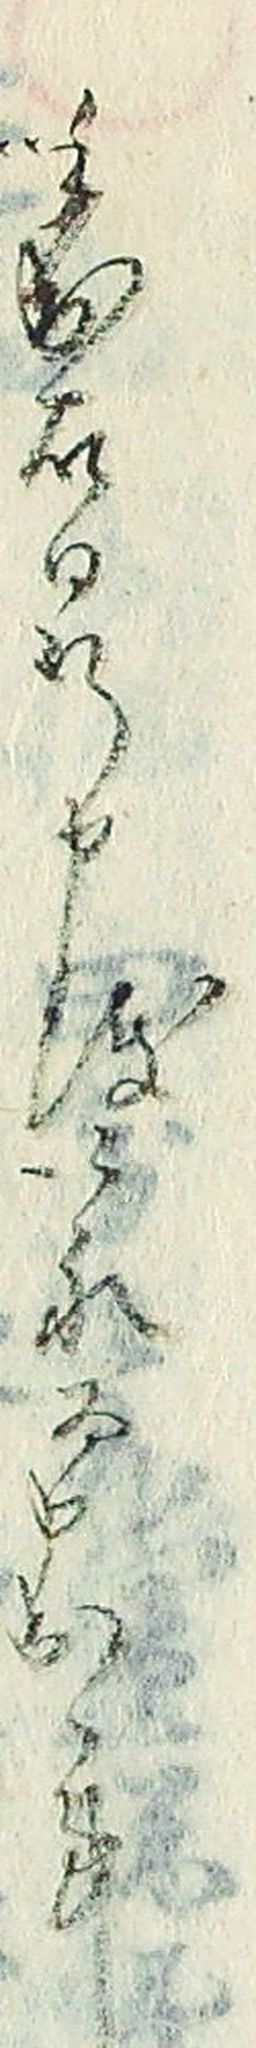呼出右同断申渡御礼為申出候事
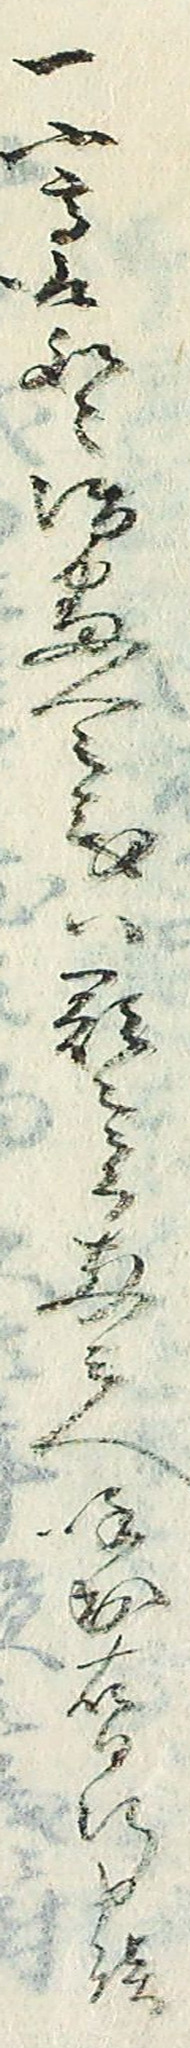一小高取処々御番人之義ハ郡々ニ而両三人呼出右同断申談
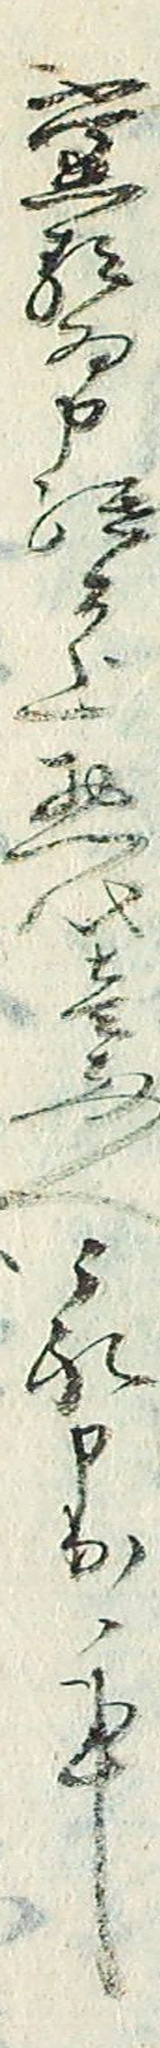黨類申継候上惣代壱両人御礼申出候事
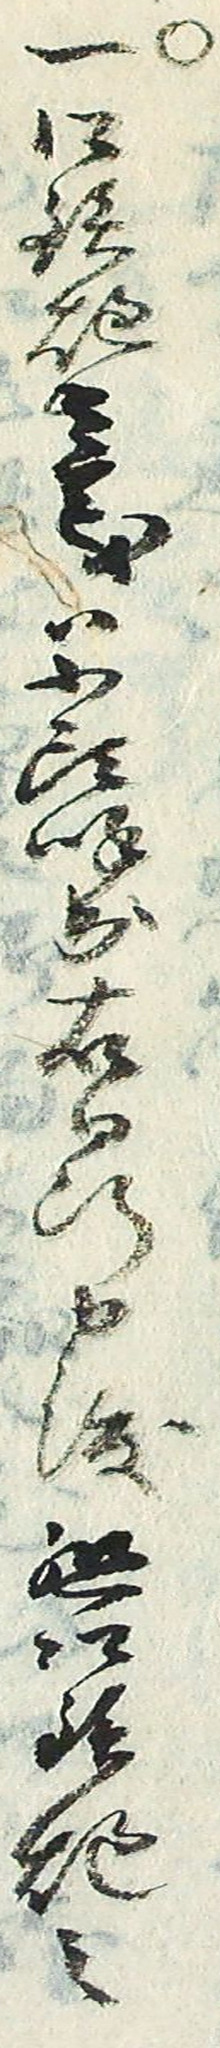一郷鉄砲之義ハ小頭呼出右同断申渡組郷鉄砲之
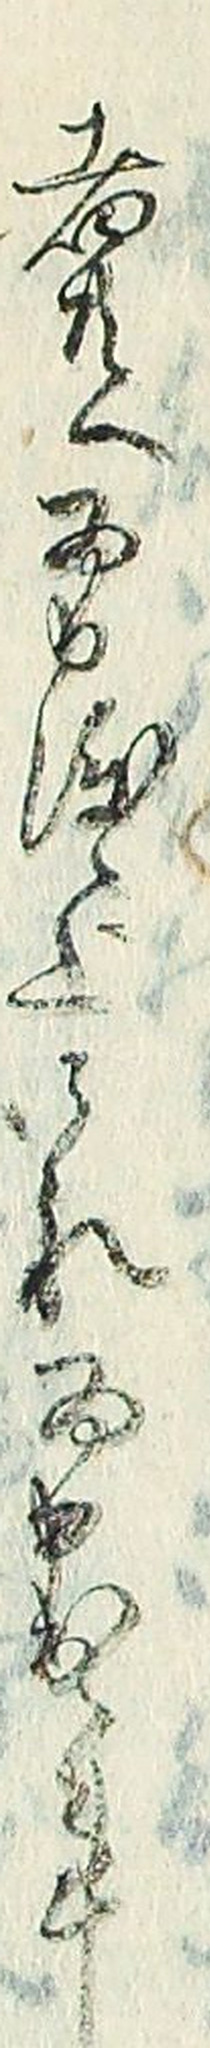者共へ為申渡候上御礼為申出候事
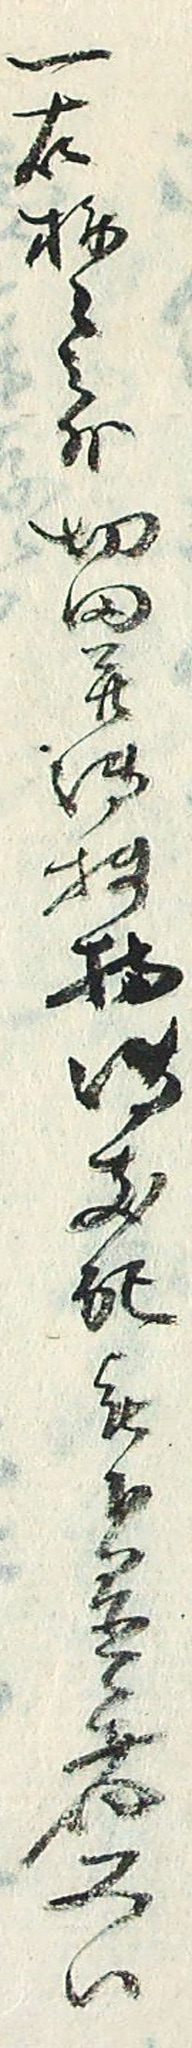一右株々外切田幷御扶持御支配被下置候者又ハ
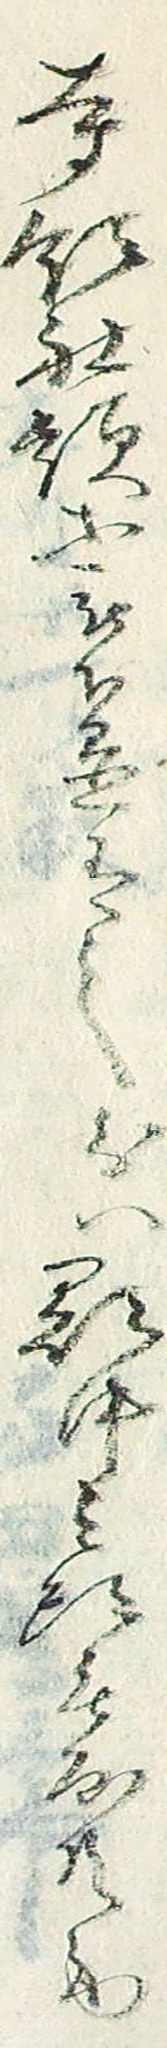寺領社領等被下置有之分ハ郡中与頭庄屋共之内

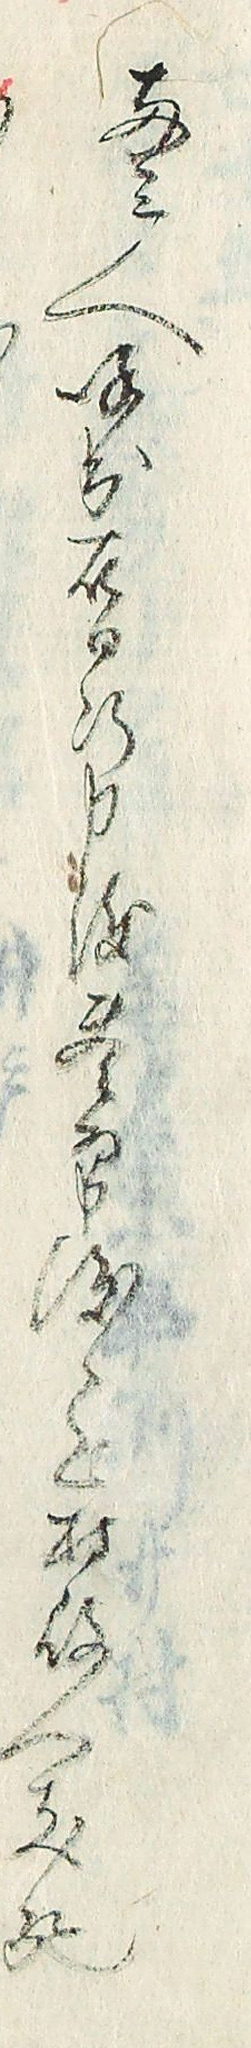両三人呼出右同断申渡夫々為申渡候上村役人支配
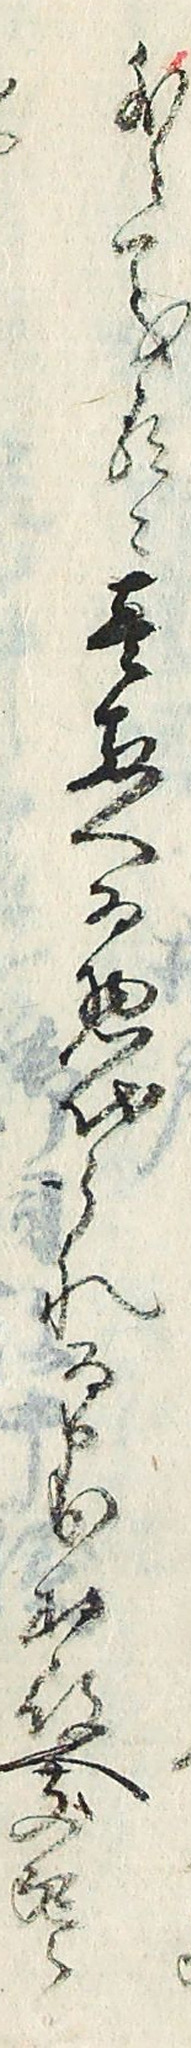外之義類々壱両人為惣代御礼為申出村役人支配之
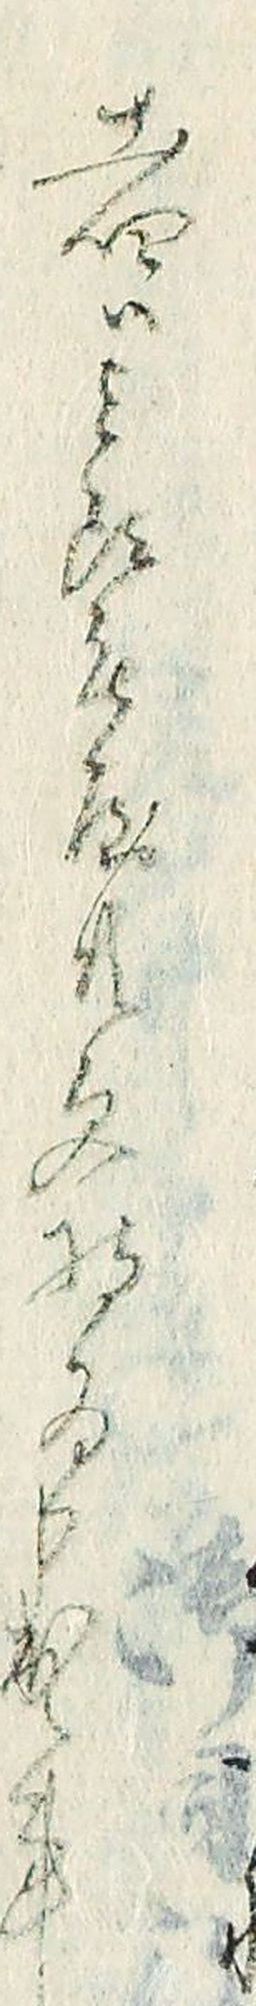者ハ与頭庄屋共受持為申出候事
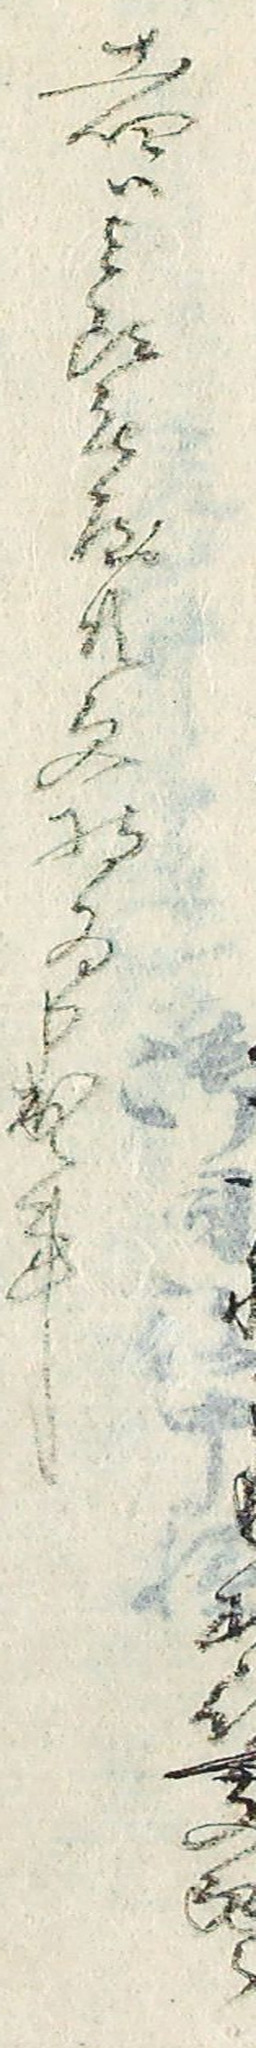者ハ与頭庄屋共受持為申出候事
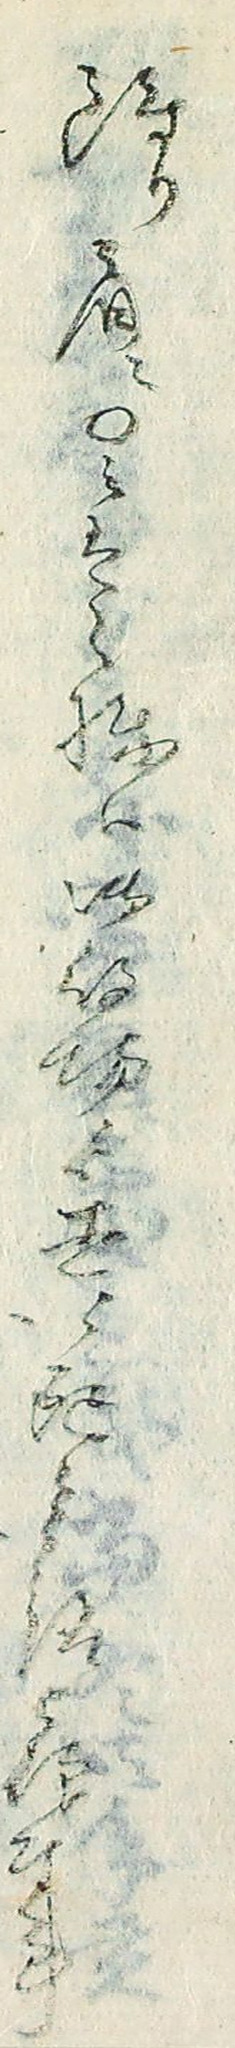附り肩ニ○之有之株ハ御役場ゟ直御配之御趣被仰付事
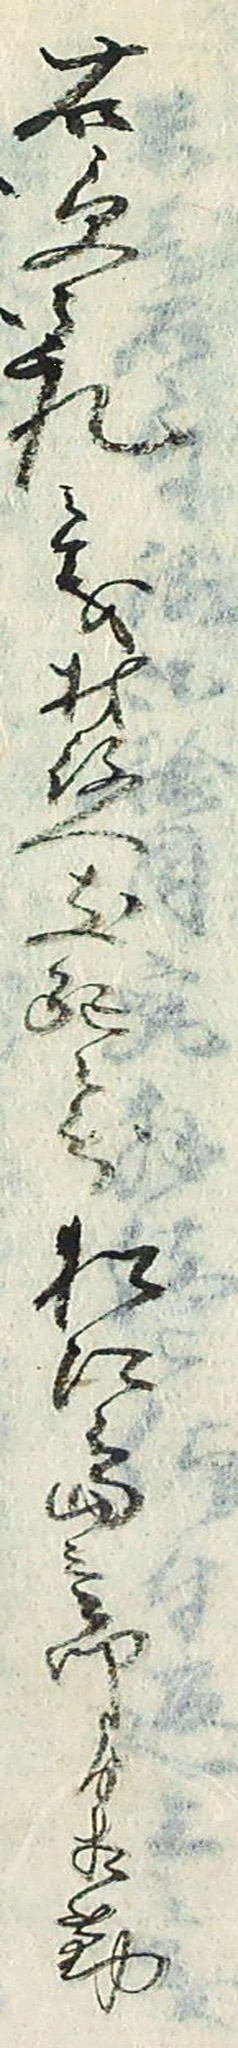右御受御礼之義村役人支配之分松江島三郎ゟ相勤
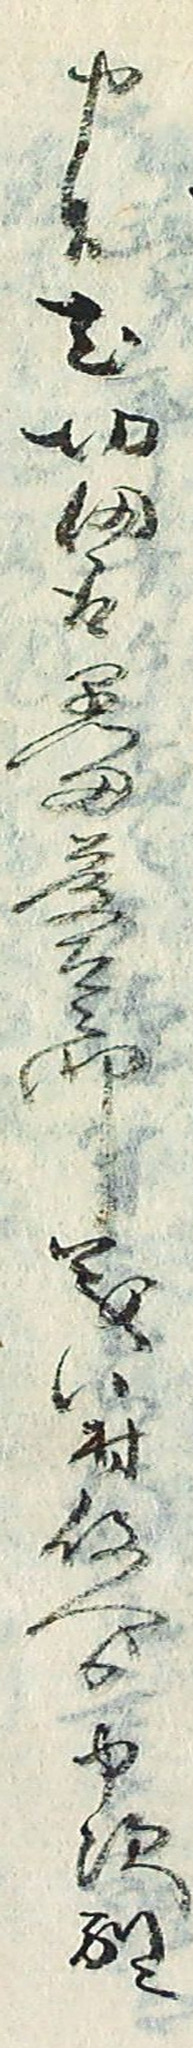申候尤切田取黒田藤太郎義ハ村役人ゟ申次別ニ
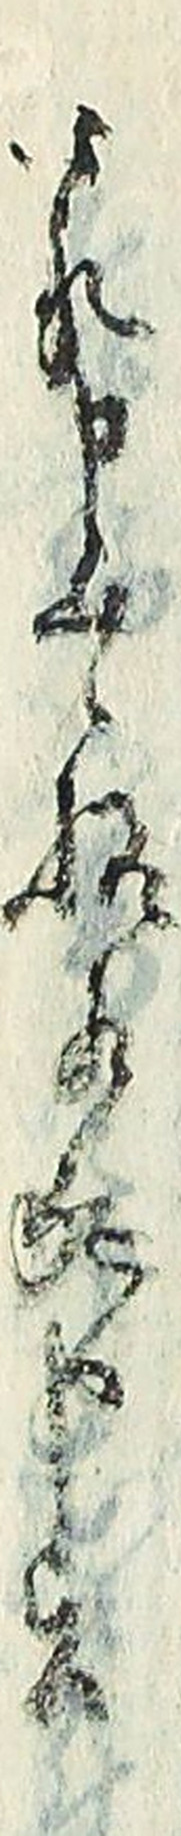御礼申上候様相配申候
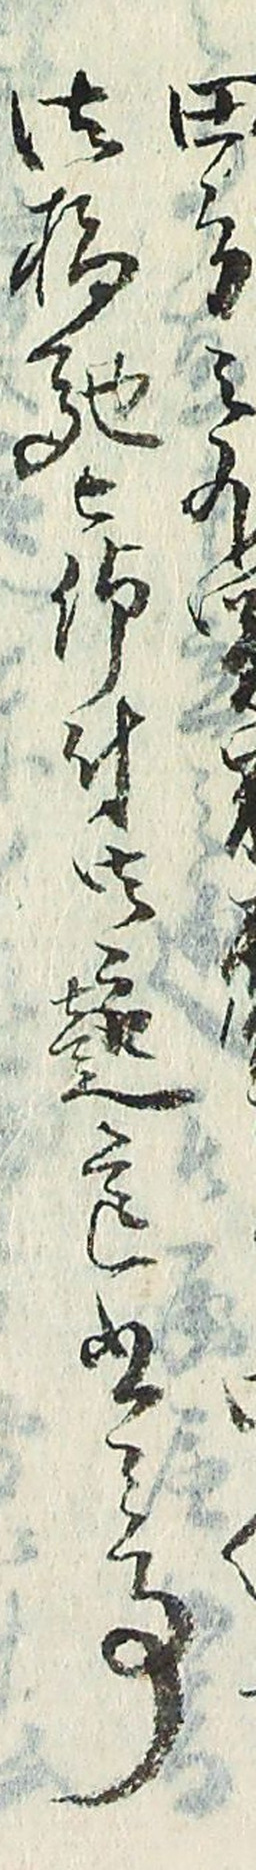御指弛被仰付御趣意書之事
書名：諸御趣意書并御下知向之写
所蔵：鳴門教育大学 Naruto University of Education
